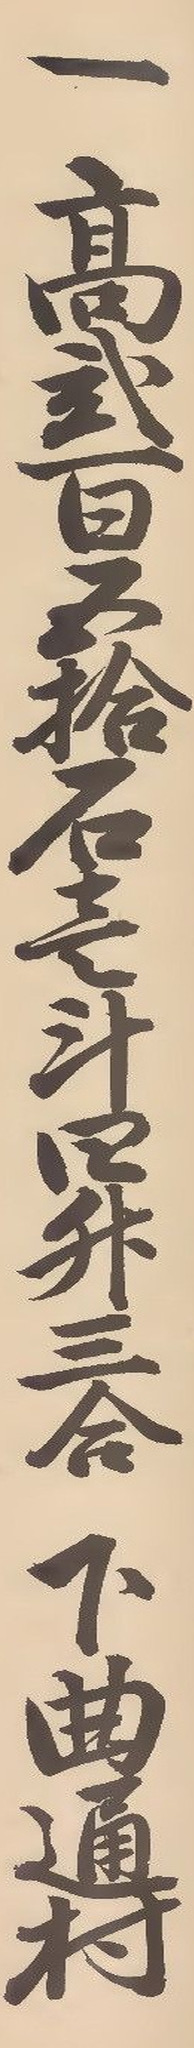一高弐百五拾石壱斗四升三合下曲通村
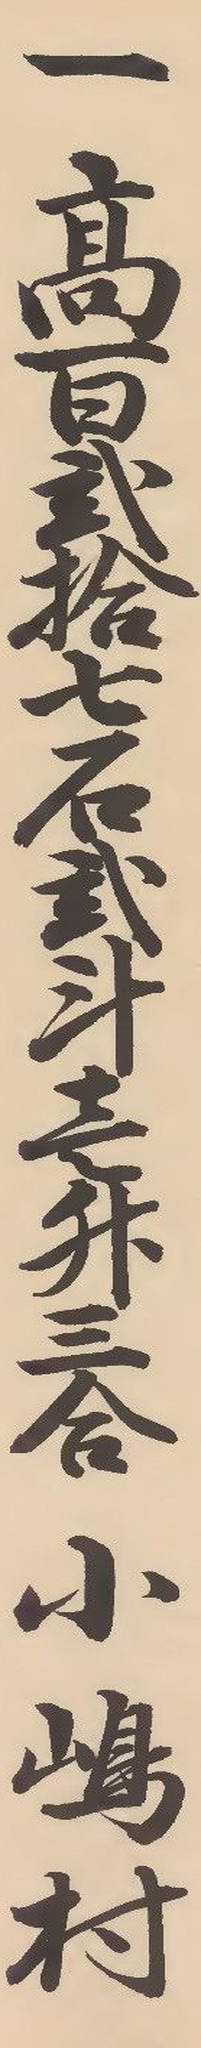一高百弐拾七石弐斗壱升三合小島村
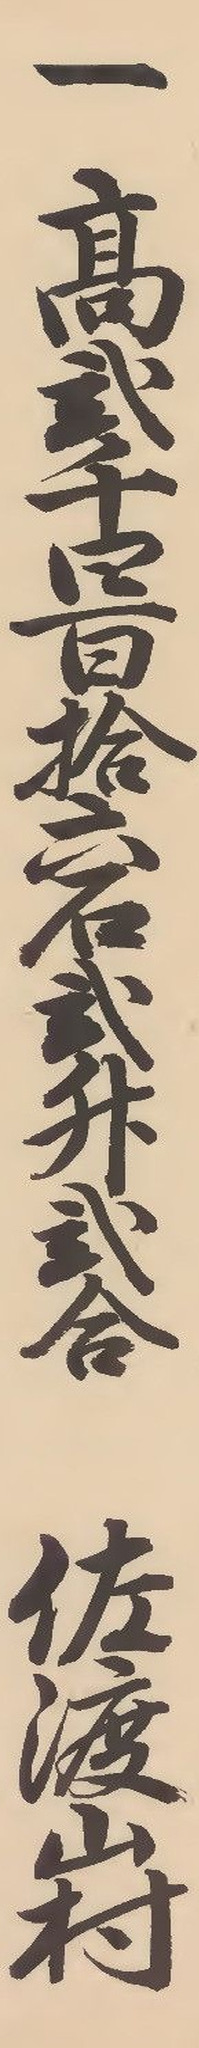一高弐千四百拾六石弐升弐合佐渡山村
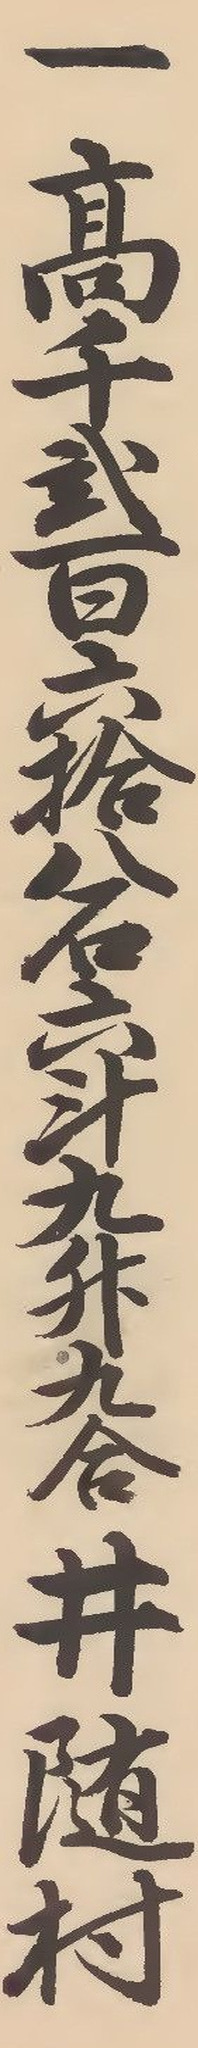一高千弐百六拾八石六斗九升九合井随村

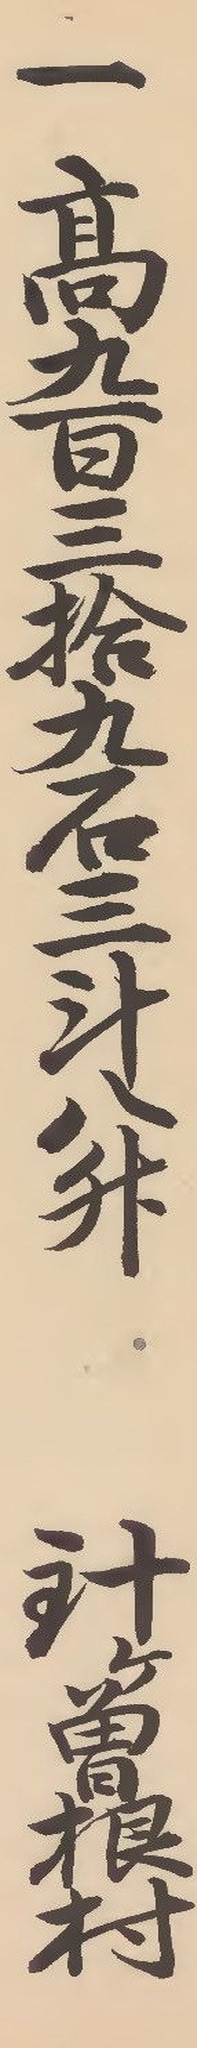一高九百三拾九石三斗八升針ヶ曾根村
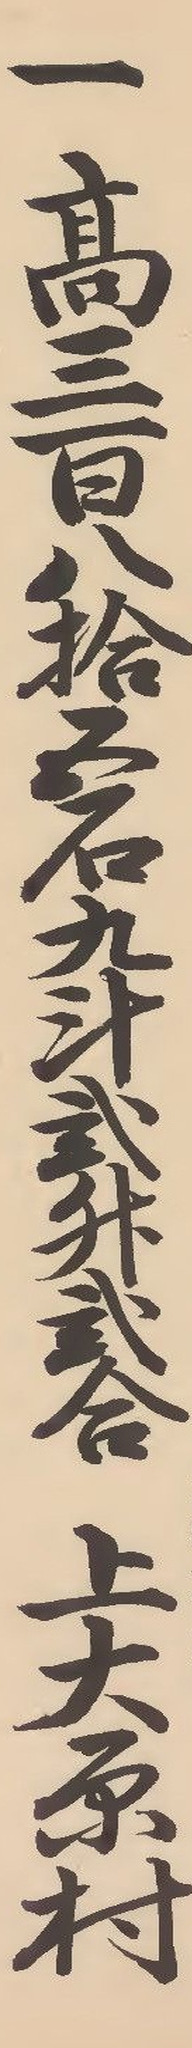一高三百八拾五石九斗弐升弐合上大原村
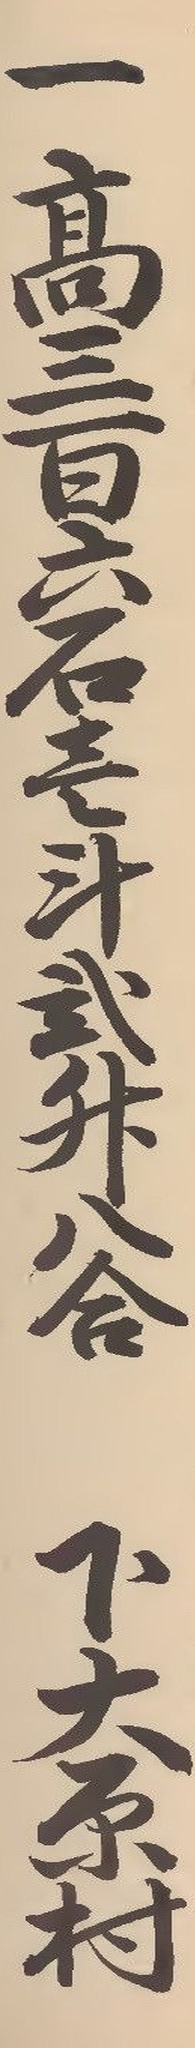一高三百六石壱斗弐升八合下大原村
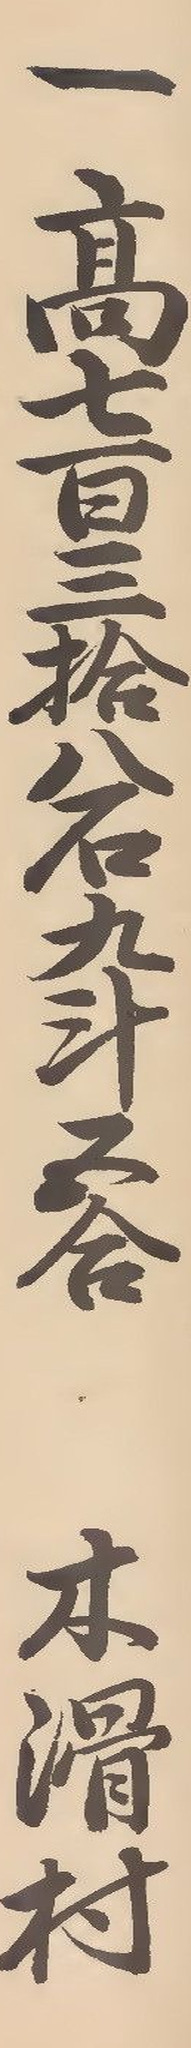一高七百三拾八石九斗五合木滑村
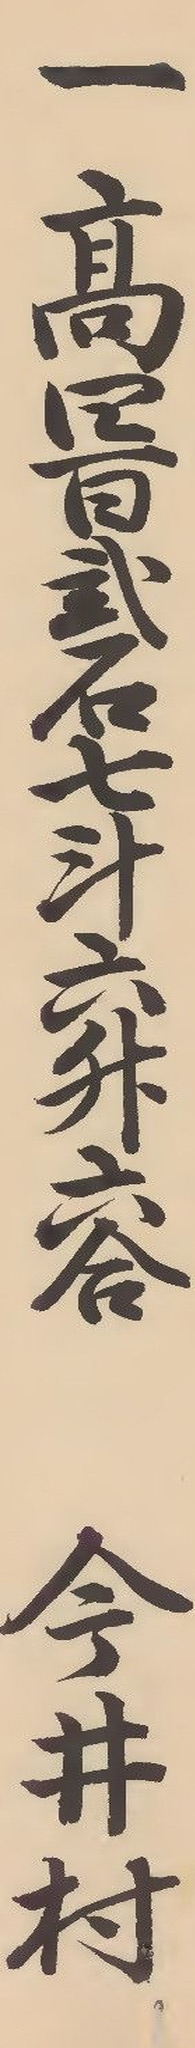一高四百弐石七斗六升六合今井村
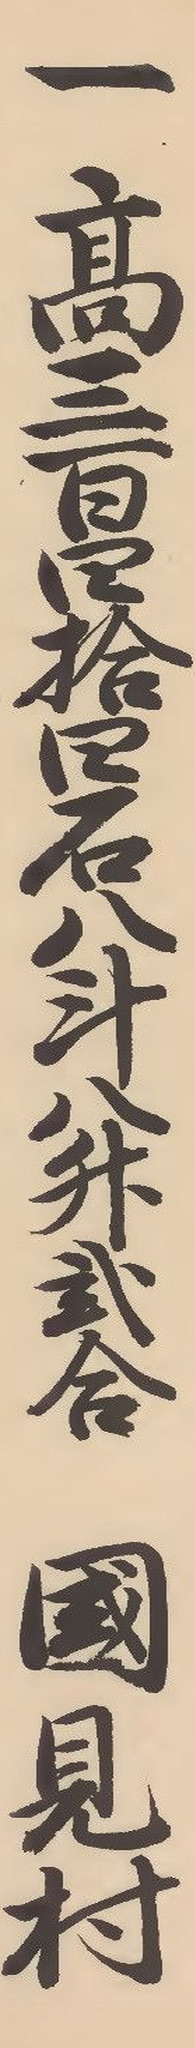一高三百四拾四石八斗八升弐合国見村
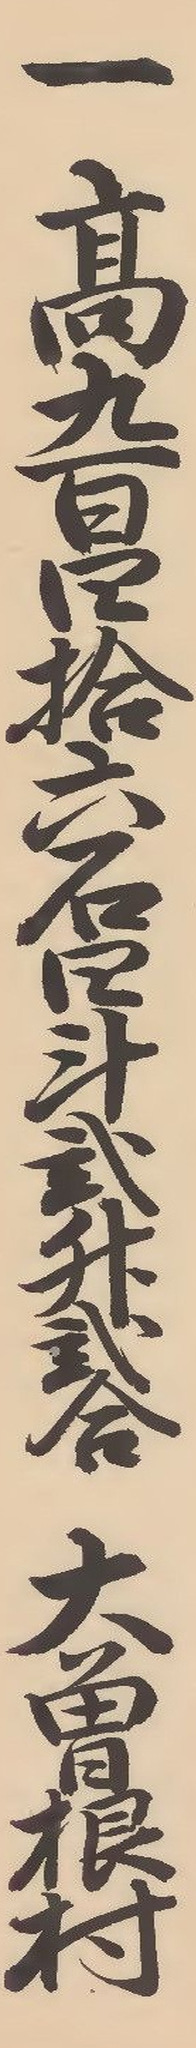一高九百四拾六石四斗弐升弐合大曽根村

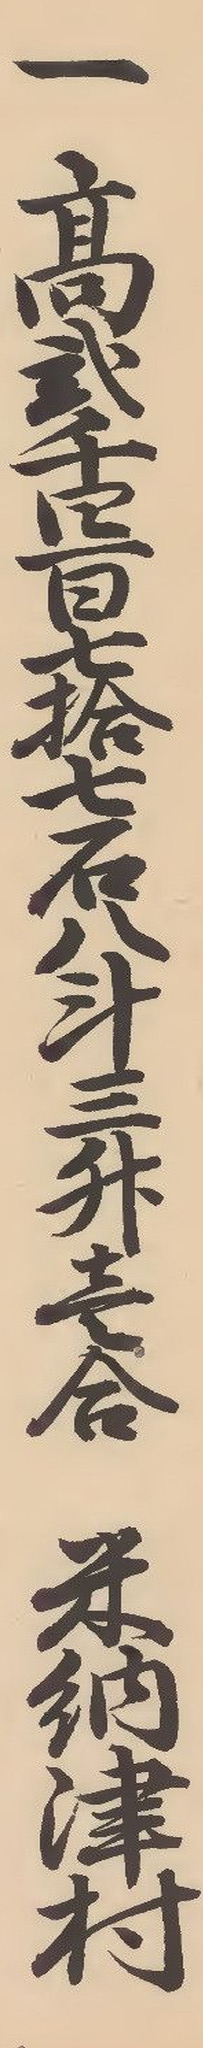一高弐千四百七拾七石八斗三升壱合米納津村
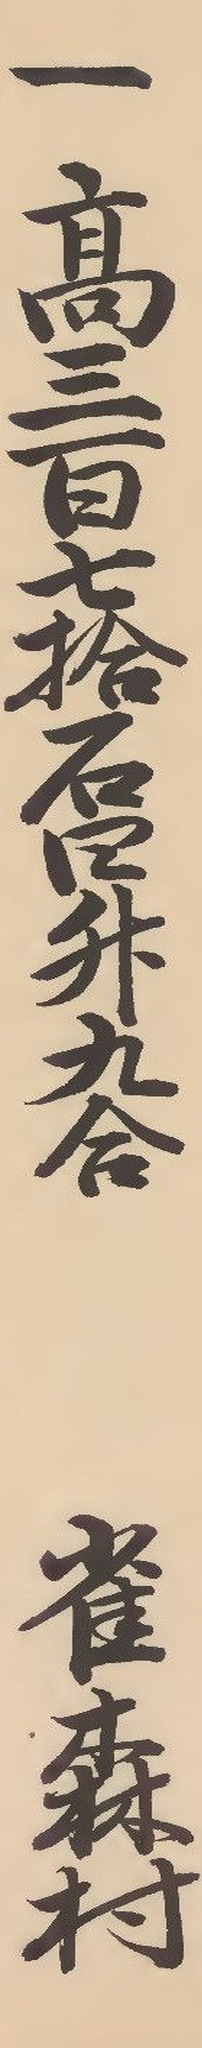一高三百七拾石四升九合雀森村
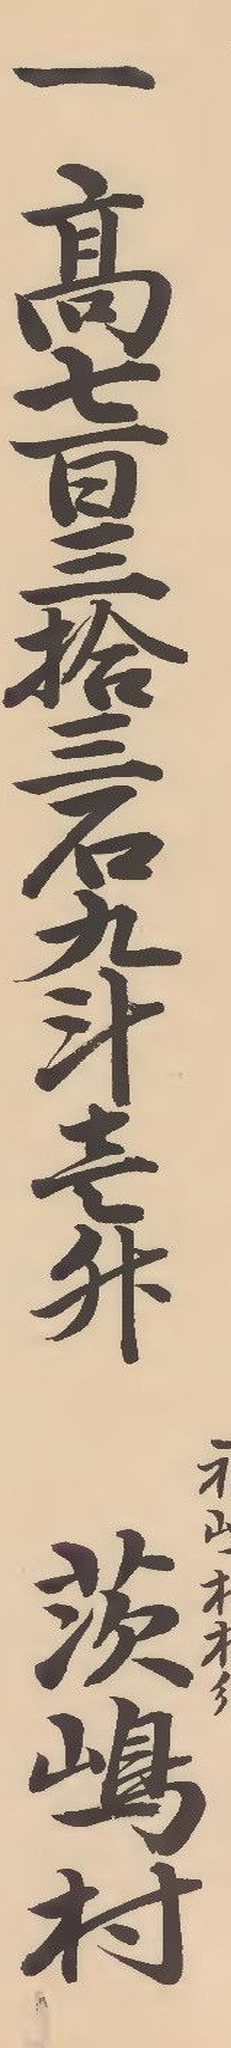一高七百三拾三石九斗壱升茨島村
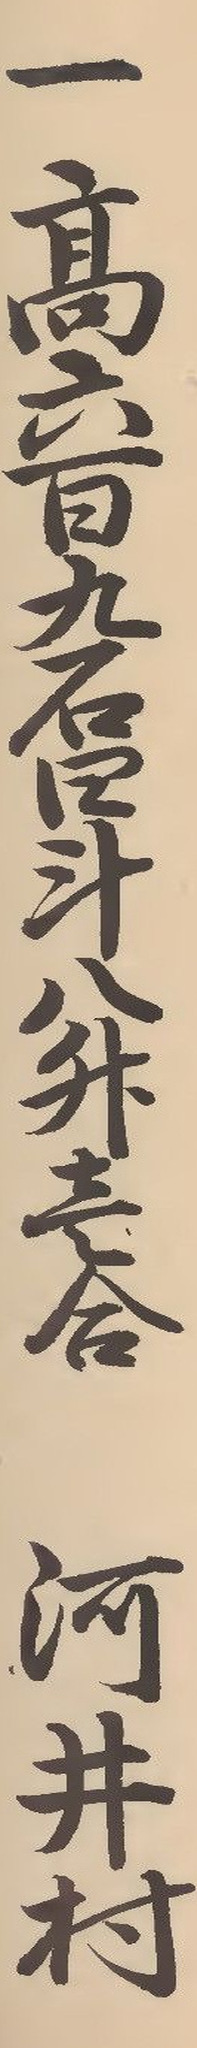一高六百九石四斗八升壱合河井村
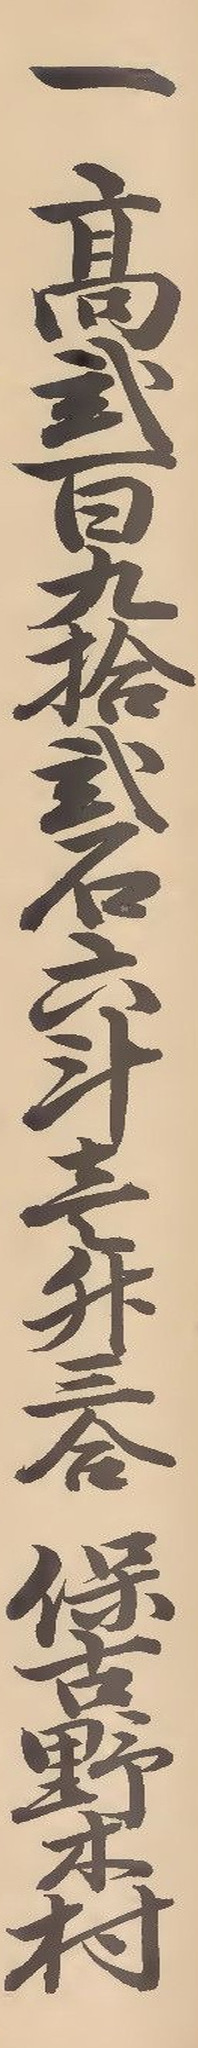一高弐百九拾弐石六斗壱升三合保古野木村
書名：越後国郷帳　下
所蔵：国立公文書館 National Archives of Japan
